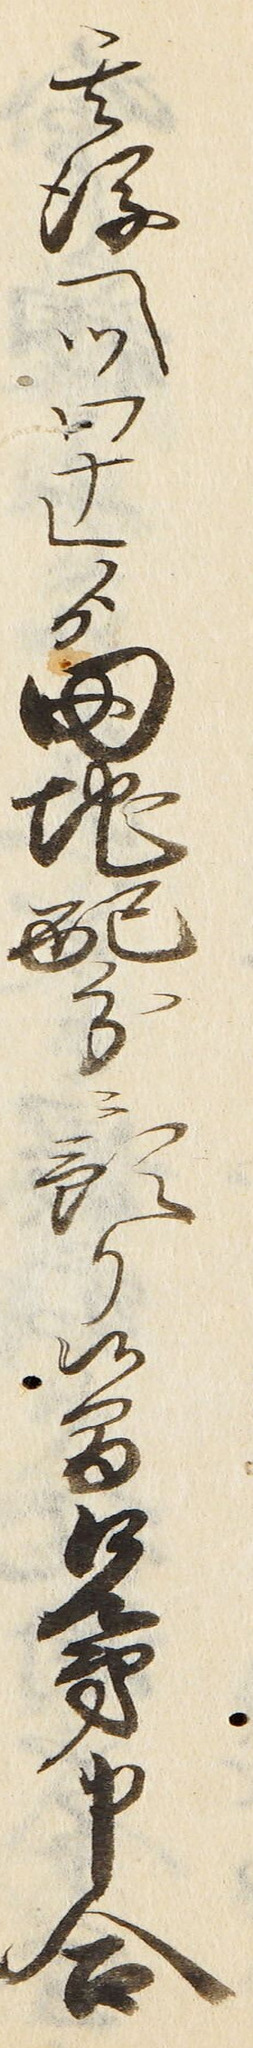其後「ツワナ」ゟ田地配分ニ預り候間兄弟申合
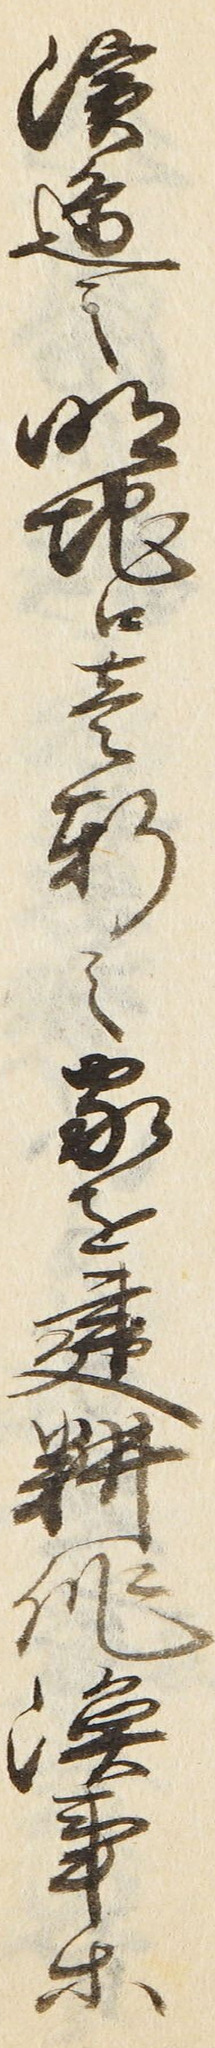濱邊之明地江壱軒之家を建耕作漁事等
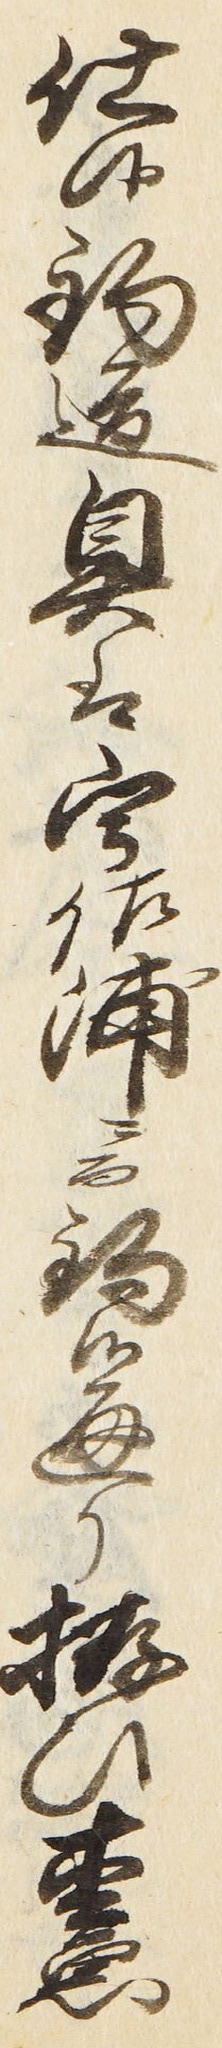仕候釣道具は宇佐浦ニ而釣候通り拵ひ枩魚
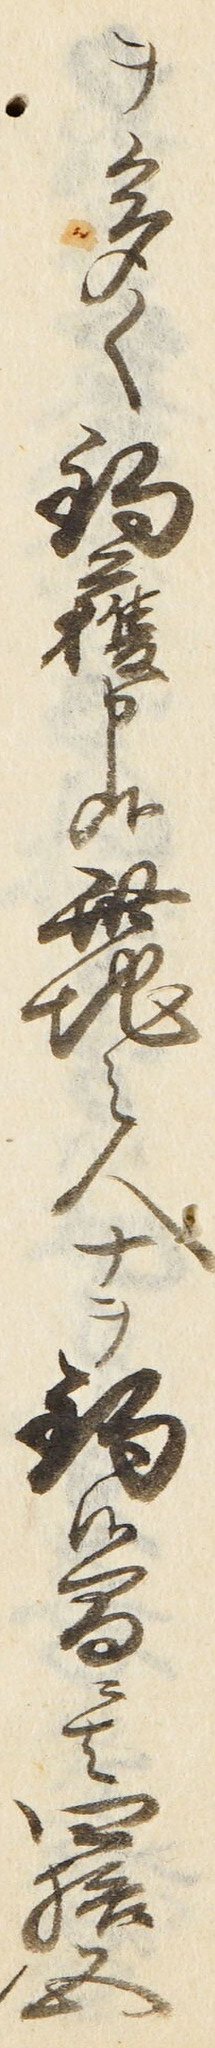ヲ多く釣獲申候此地之人ナヲ釣候間ニ者四拾五
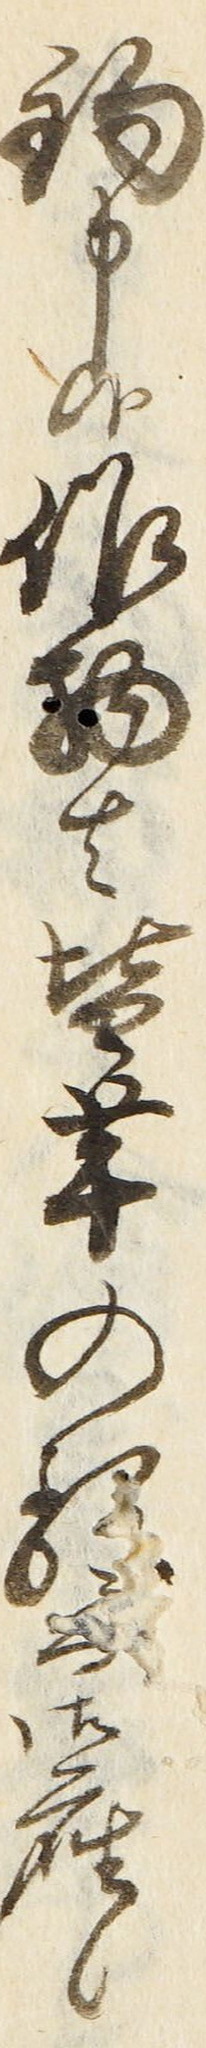釣申候作物者皆芋の類ニ而御座候
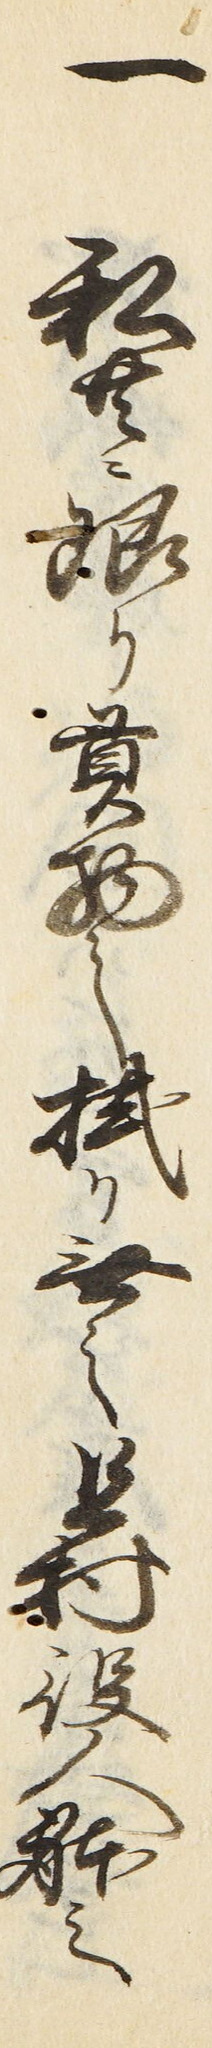一私共ニ限り貢物之掛り無之且村役人躰之
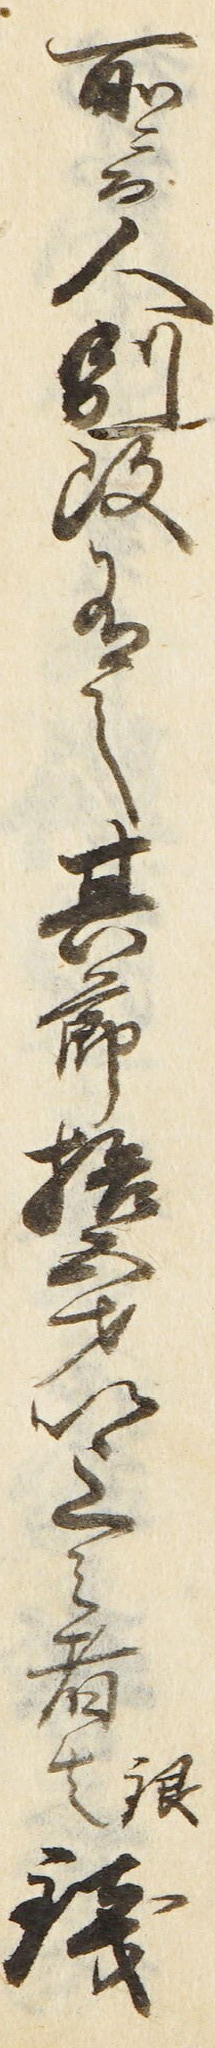所ニ而人別改有之其節拾五才以上之者者銀銭
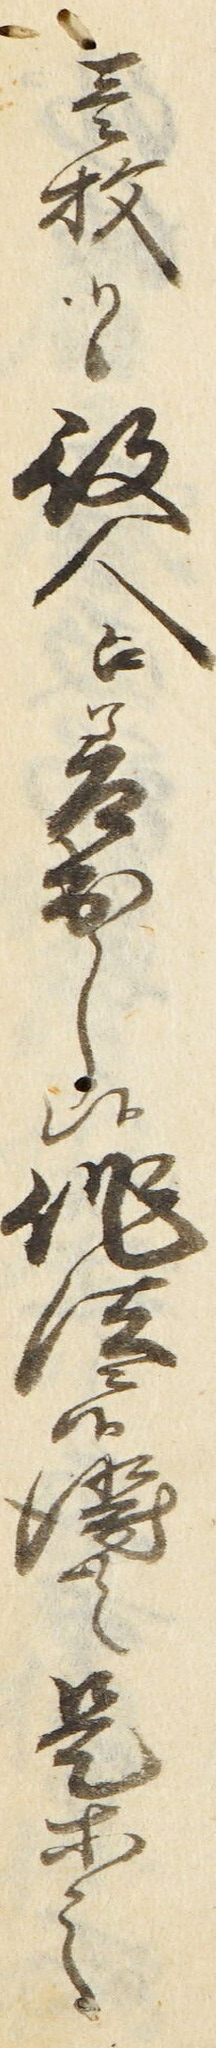壱枚ツヽ役人江差出し候作法ニ候得共是等之

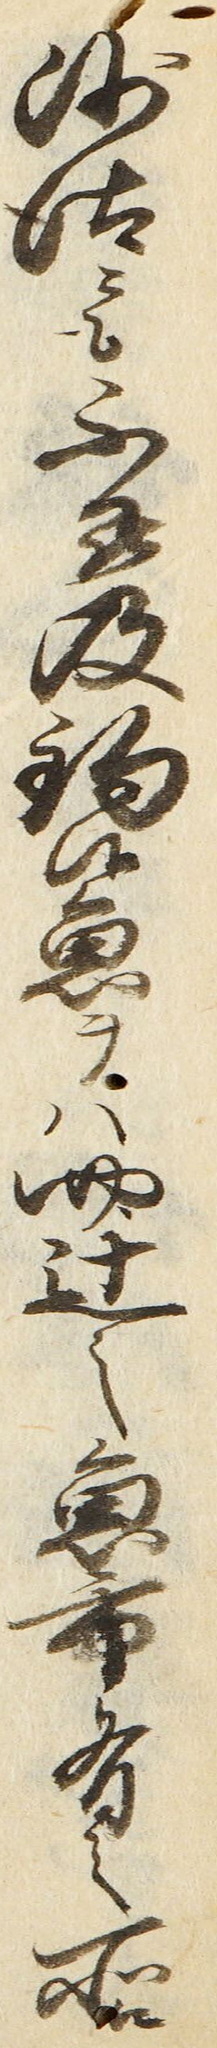沙汰ニも不被及釣候魚ヲハ四辻之魚市有之所江
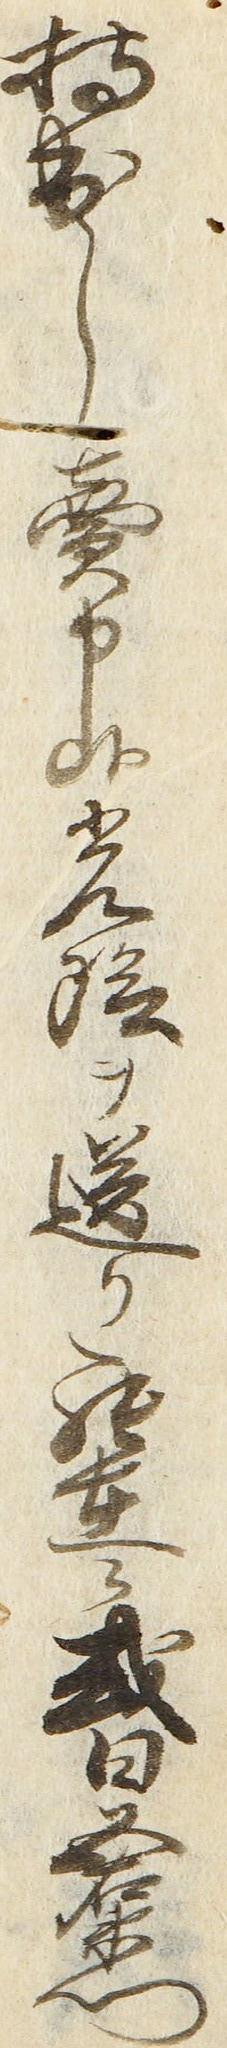持出し賣申候光陰ヲ送り罷在候或日又五右衛門
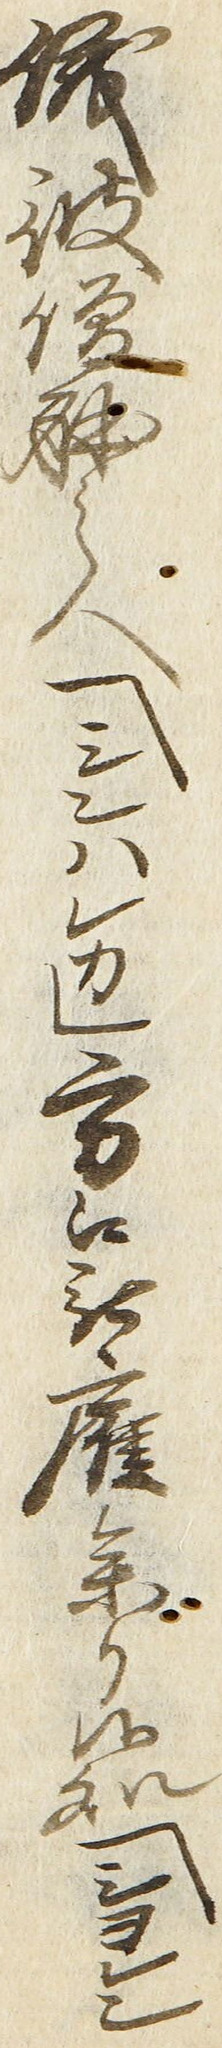儀彼僧躰之人「シンハレカ」方江被雇参り候処「シヨレン
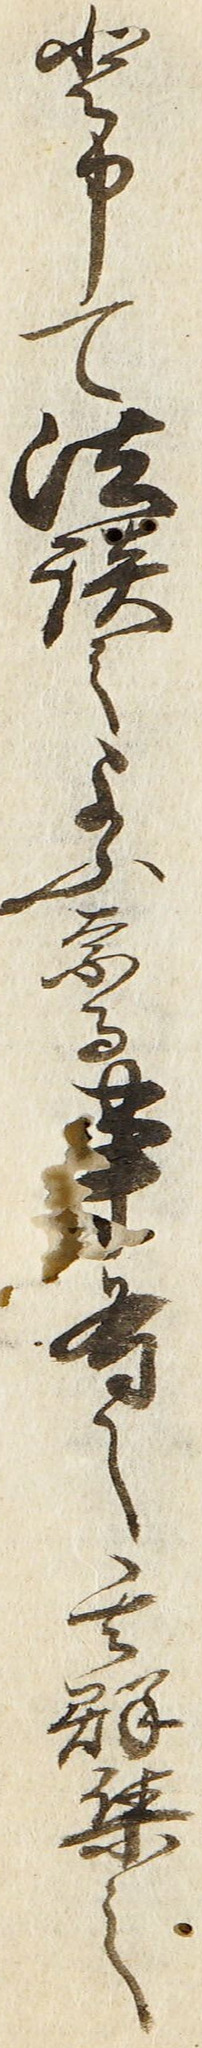と申て法談之よふなる事有之其群集之
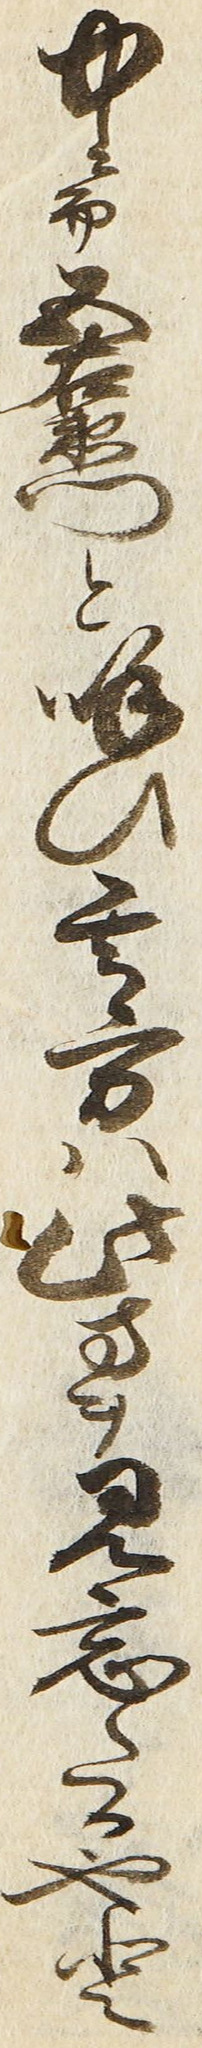中ニ而五右衛門と呼ひ其方ハ此方ヲ見忘たるやと
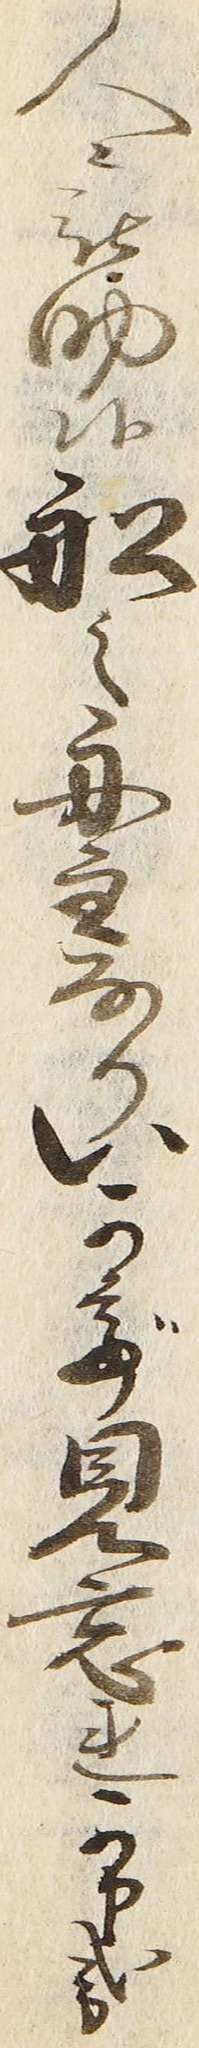人ニ被助候舩之舟主なりいかで見忘れ可申哉
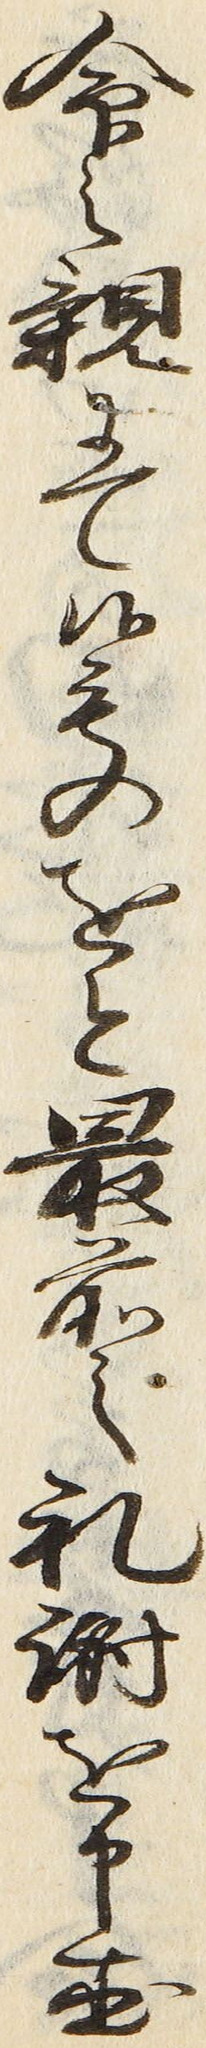命之親にて候ものをと最前之礼謝を申述】
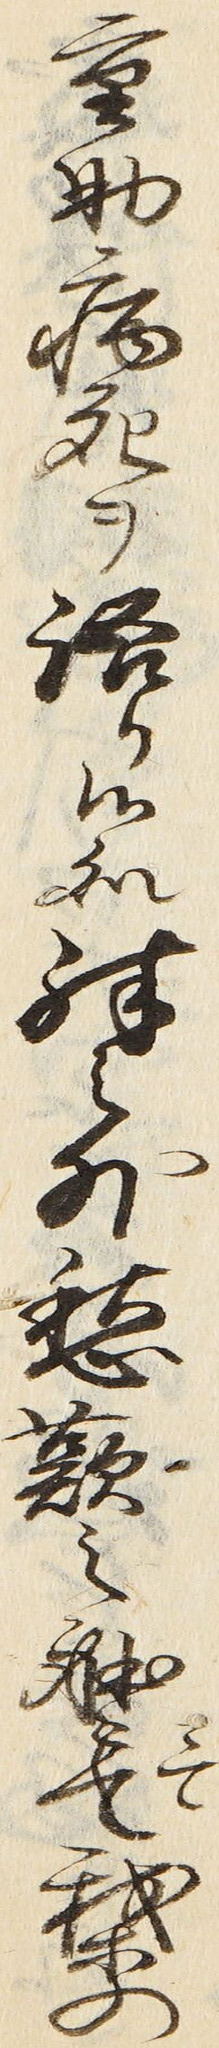重助病死ヲ語り候処殊之外愁歎之躰にて我等の
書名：漂客談寄
